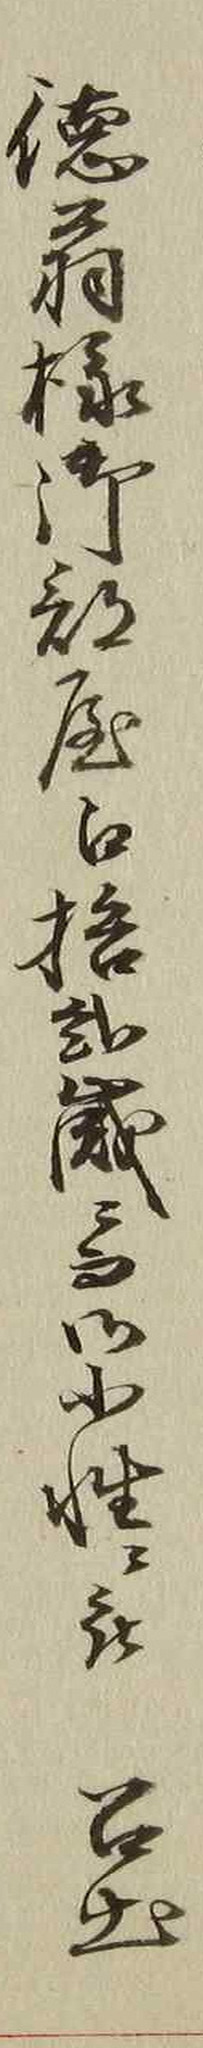徳翁様御部屋江拾弐歳ニ而御小姓ニ被召出
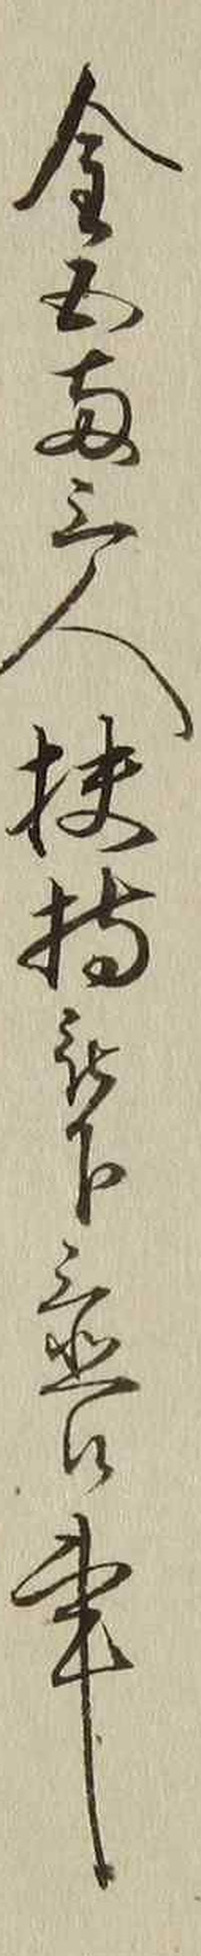金五両三人扶持被下置候事
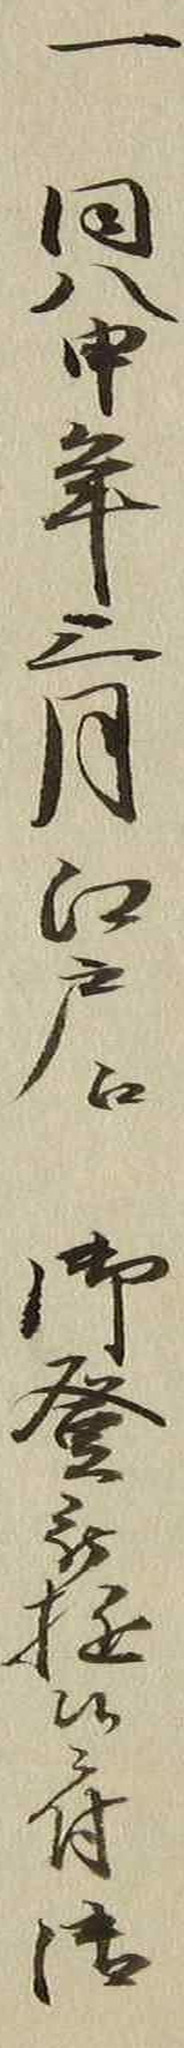一同八申年三月江戸江御登被遊候ニ付御
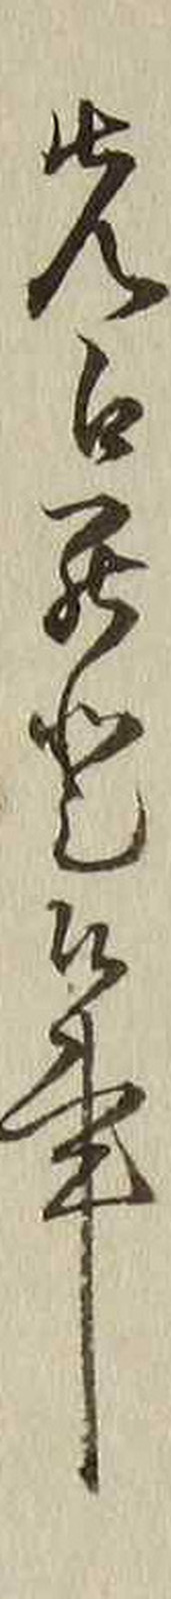先江罷登候事
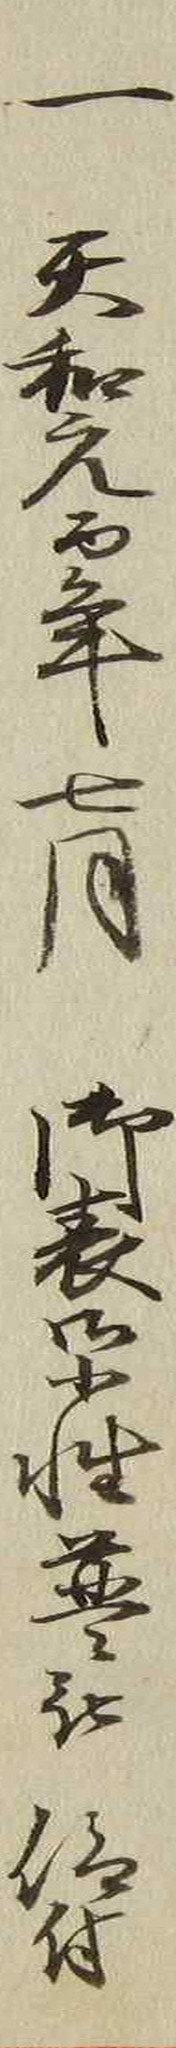一天和元酉年七月御表御小姓並ニ被仰付
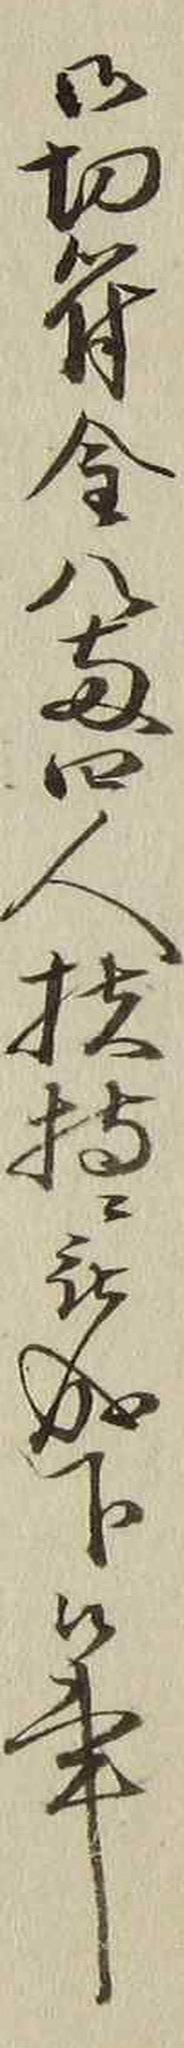御切符金八両四人扶持ニ被成下候事
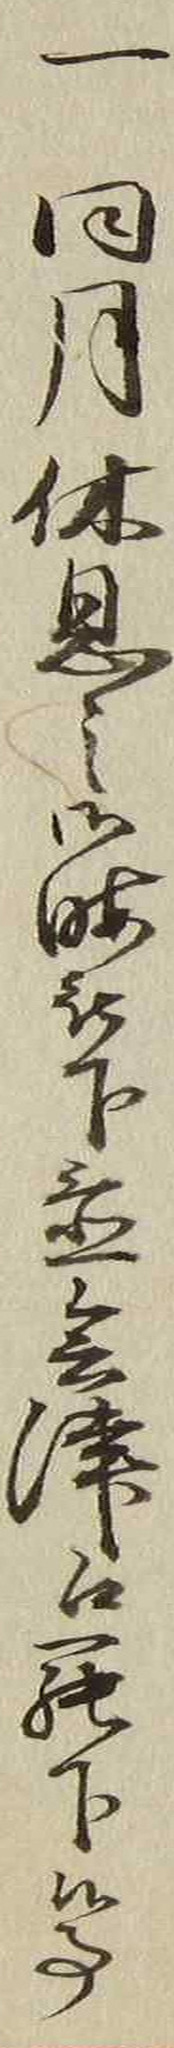一同月休息之御暇被下置会津江罷下候事
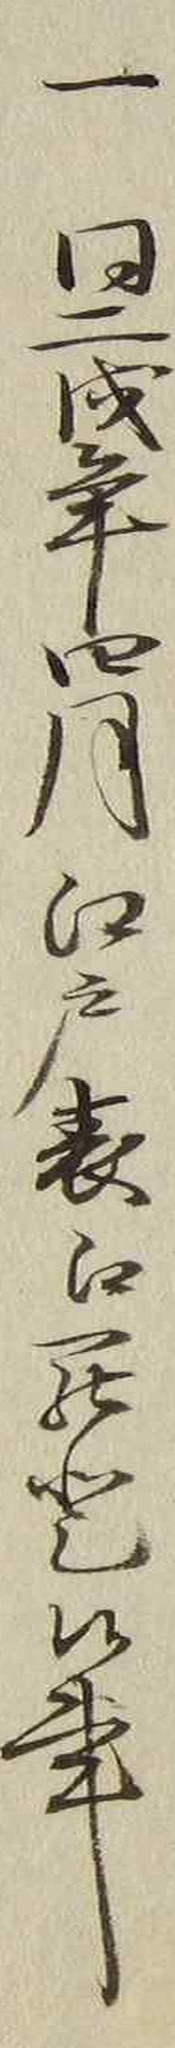一同ニ戌年四月江戸表江罷登候事
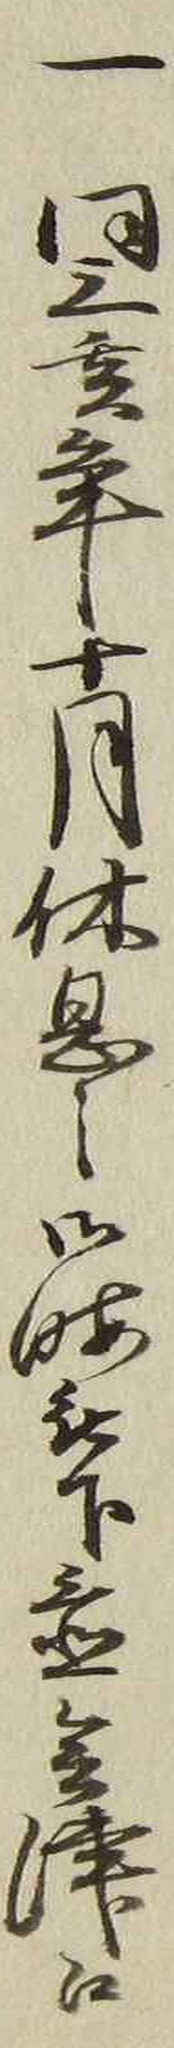一同三亥年十月休息之御暇被下置会津江
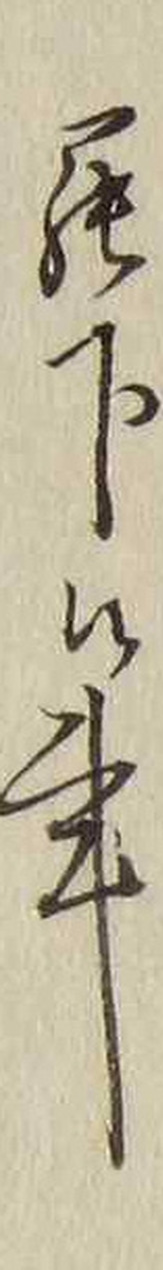罷下候事
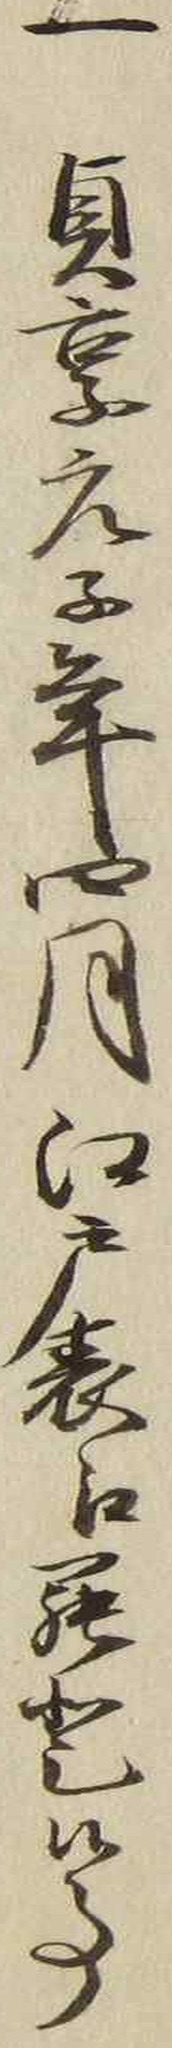一貞享元子年四月江戸表江罷登候事

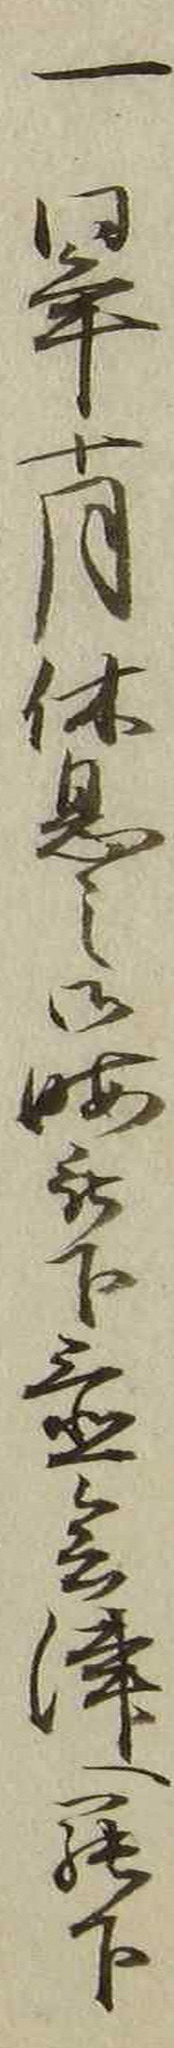一同年十月休息之御暇被下置会津へ罷下
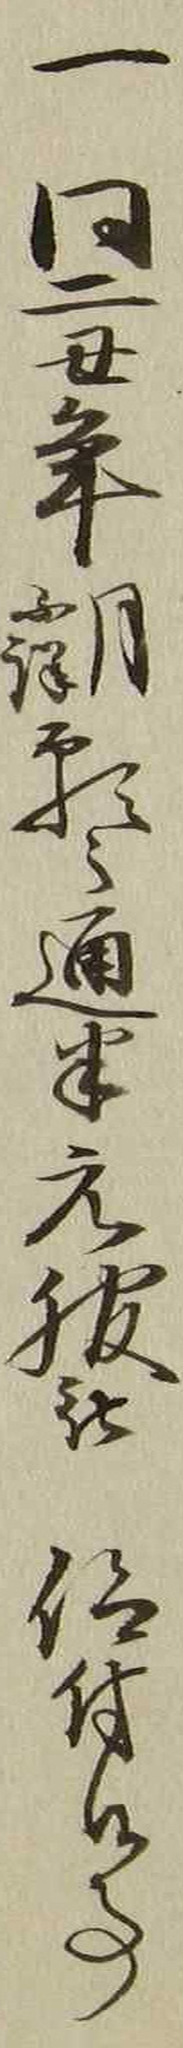一同ニ丑年月ふ詳願之通半元服被仰付候事
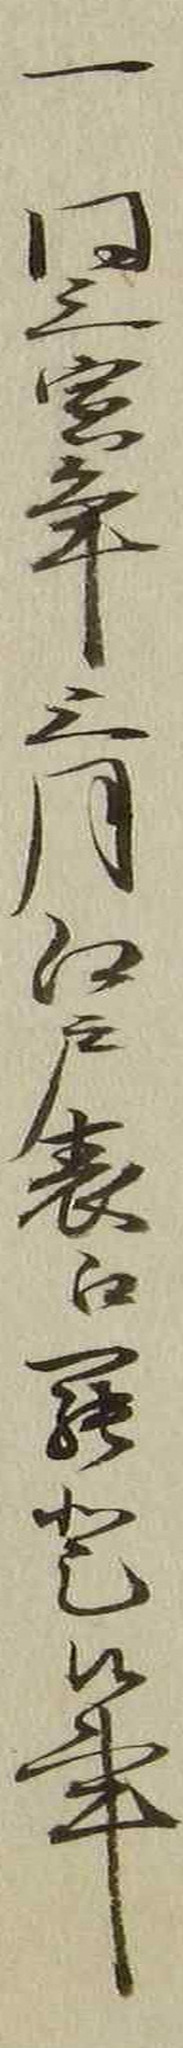一同三寅年三月江戸表江罷登候事
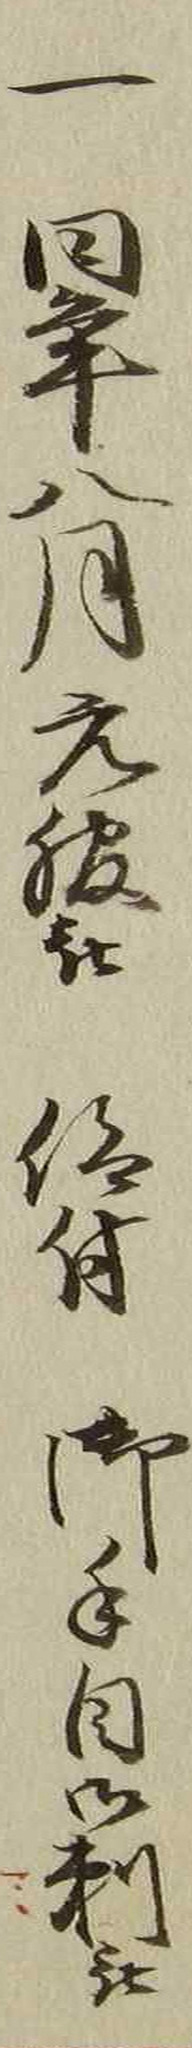一同年八月元服被仰付御手目御刺被
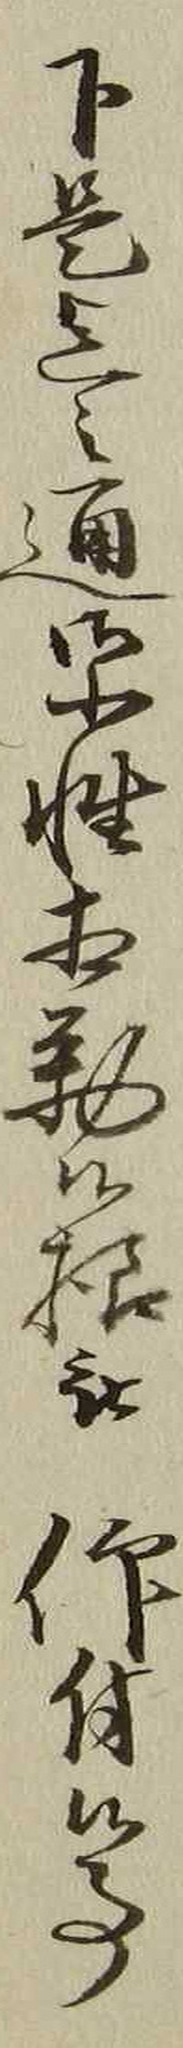下是迄之通御小姓相勤候様被仰付候事
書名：諸士系譜　巻之114　か之部22
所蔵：会津若松市立会津図書館
